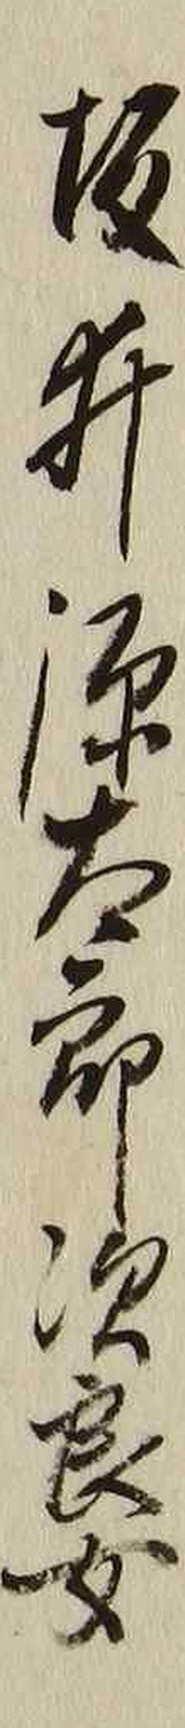坂井源太郎次良女
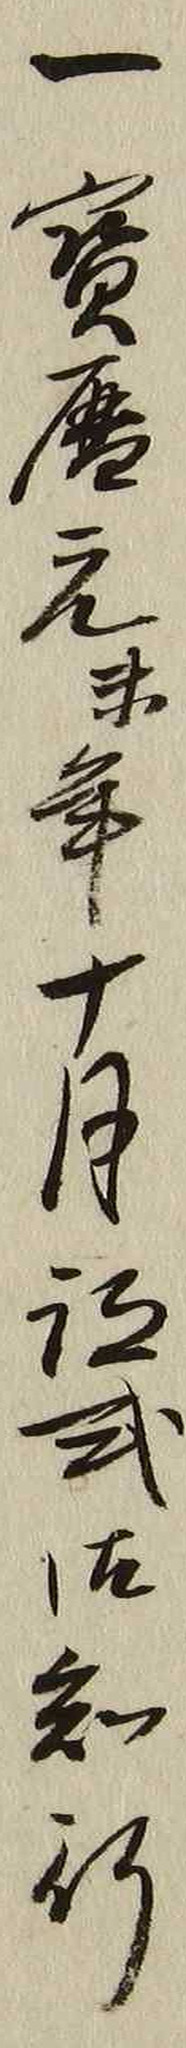一宝暦元未年十月跡式御知行
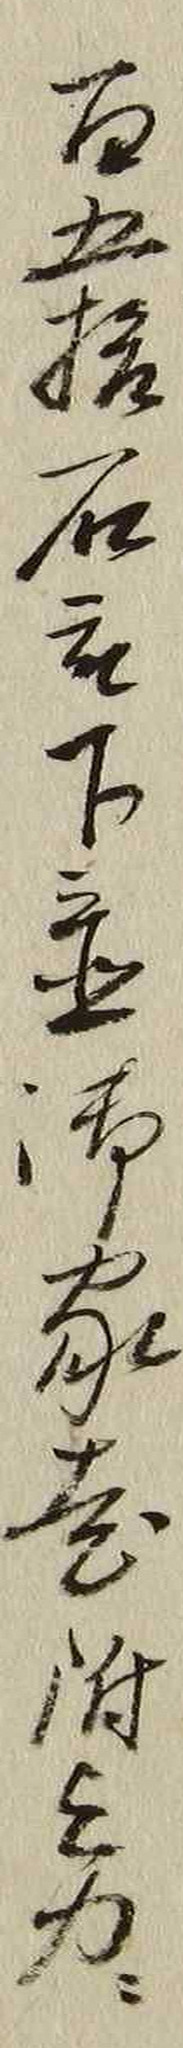百五拾石被下置御家老附与力
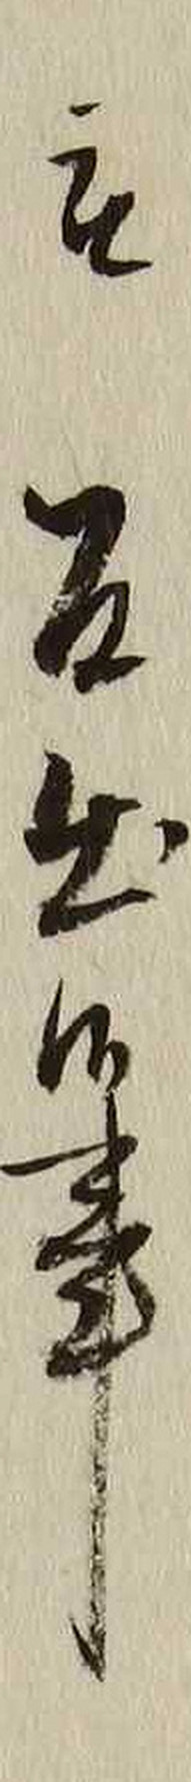被召出候事
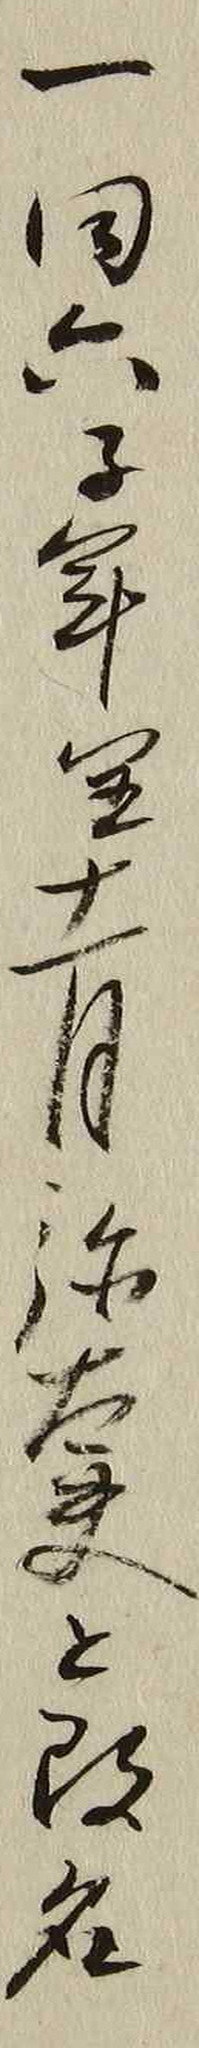一同六子年閏十一月弥太夫と改名
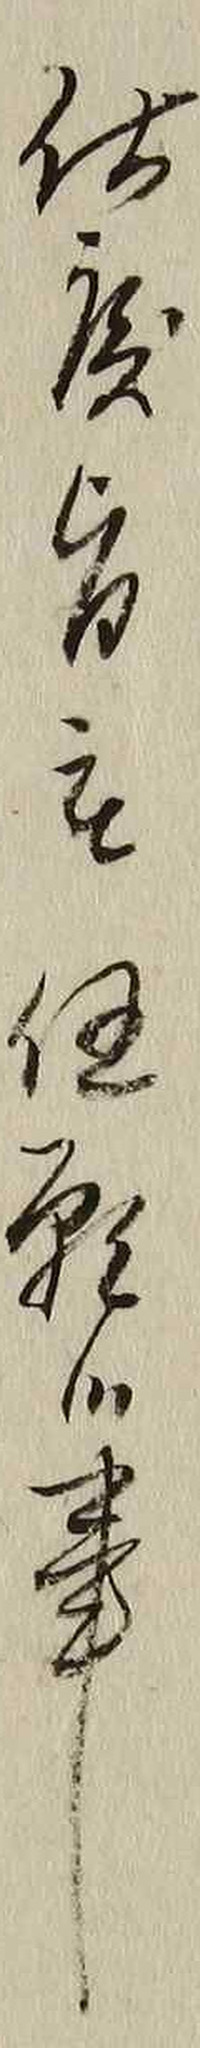仕度旨被任願候事
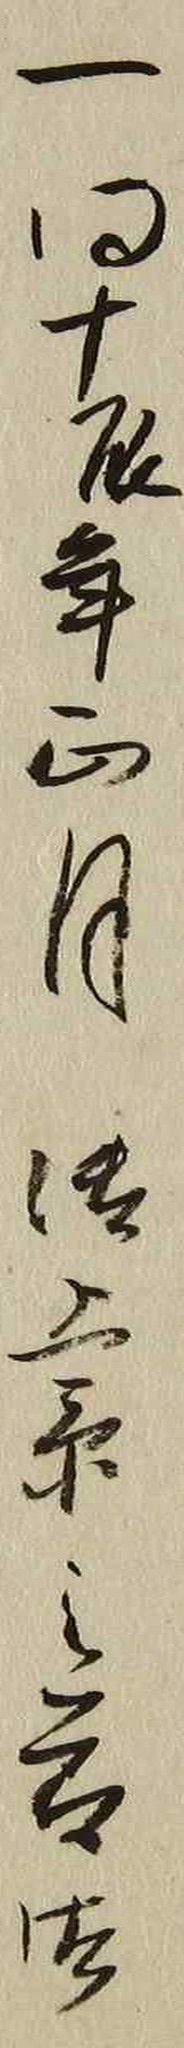一同十辰年正月御上京之節御
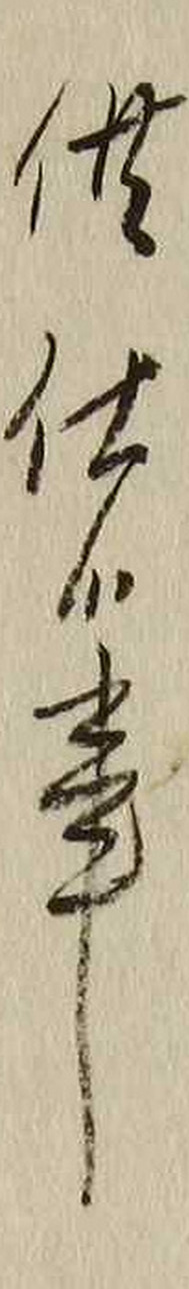供仕候事
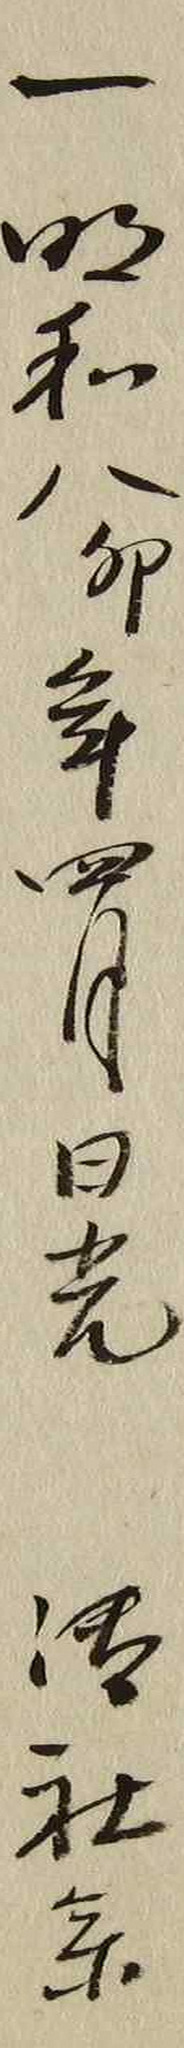一明和八卯年四月日光御社参
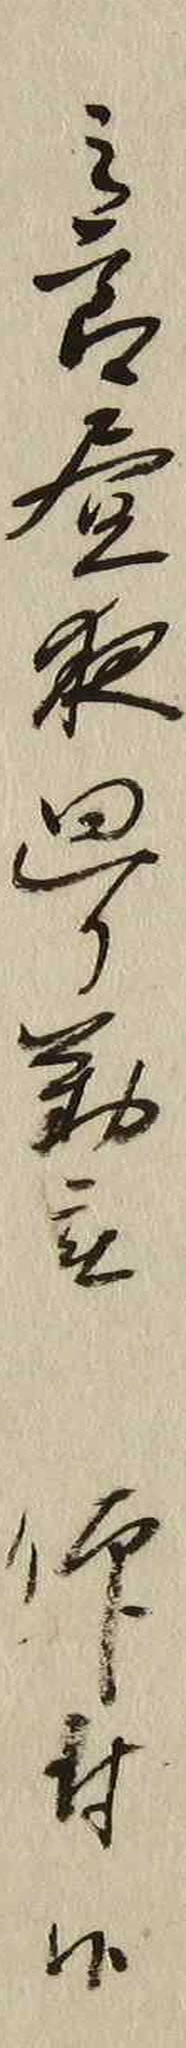之節昼夜廻り勤被仰付候
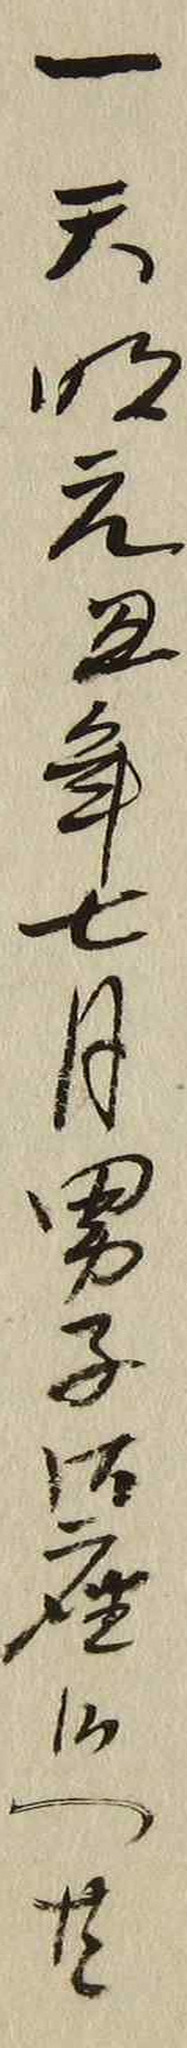一天明元丑年七月男子御座候へ共
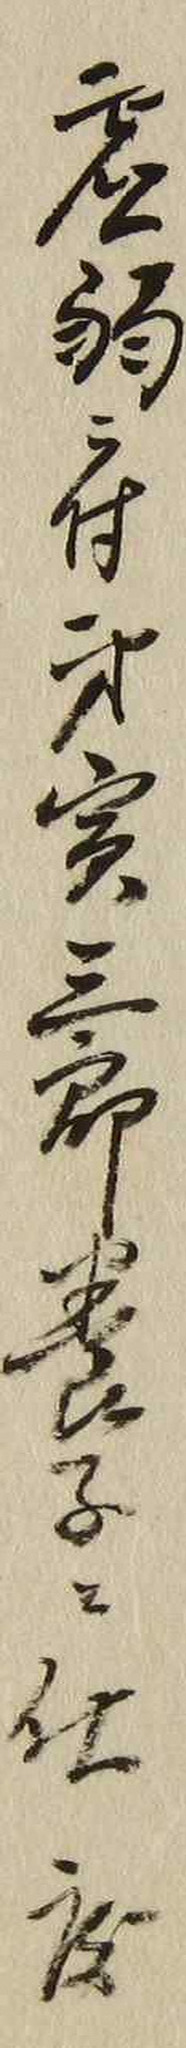虚弱付弟寅三郎養子仕度
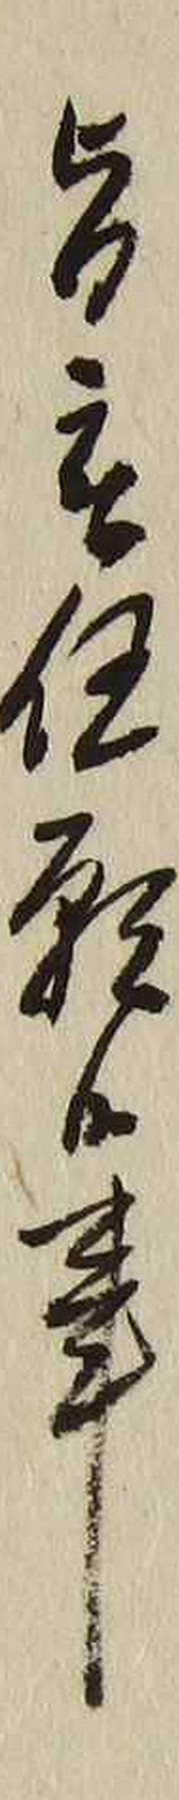旨被任願候事
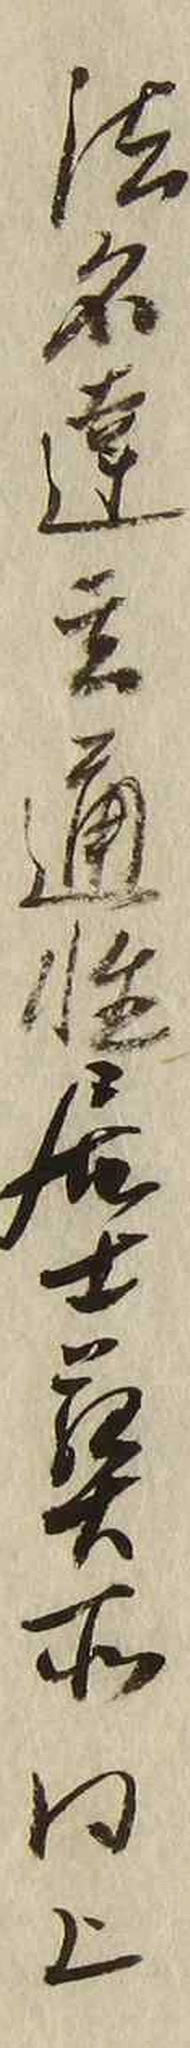法名達玄通性居士葬所同上

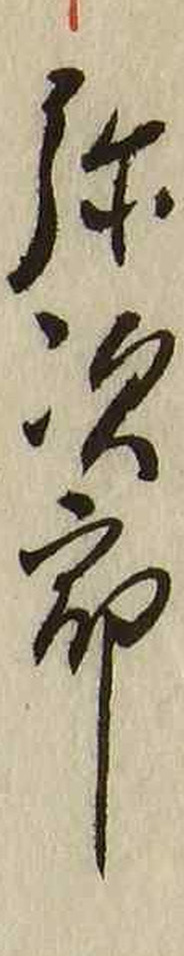弥次郎
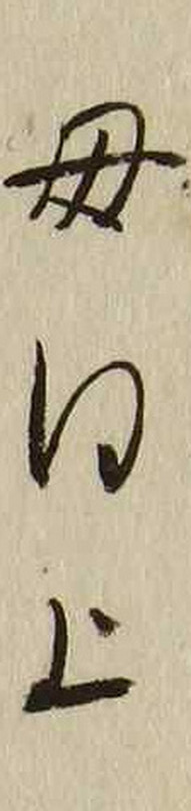母同上
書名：諸士系譜　巻之350　せ之部1冊全
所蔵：会津若松市立会津図書館
